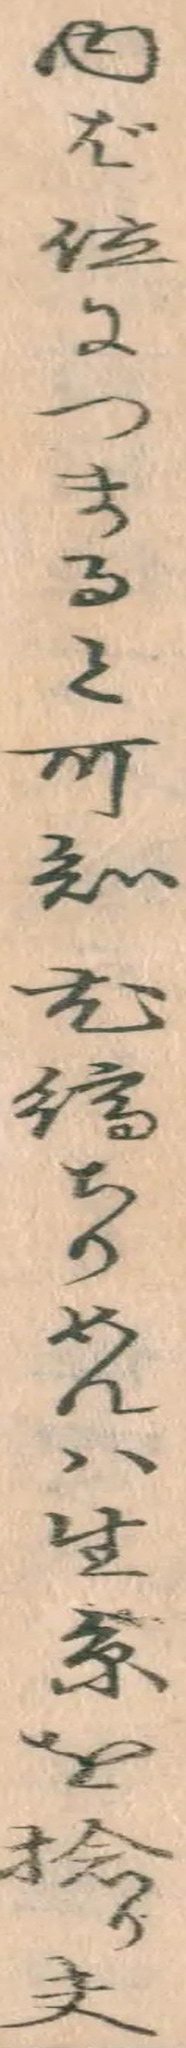内ば位につまると可知尤縞ちりめんは生糸を捻り夫
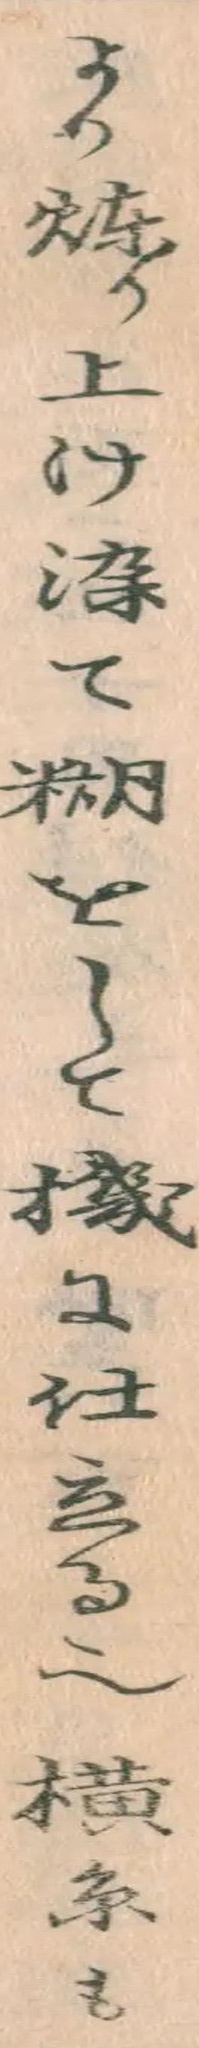より煉り上け染て糊をして機に仕立る也横糸も
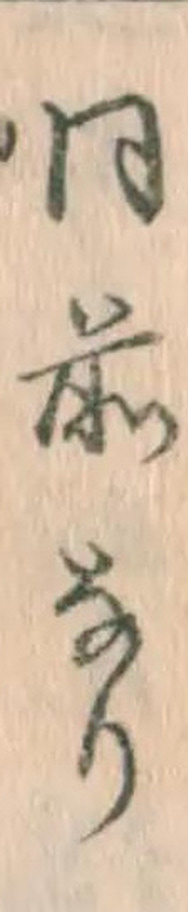同前なり
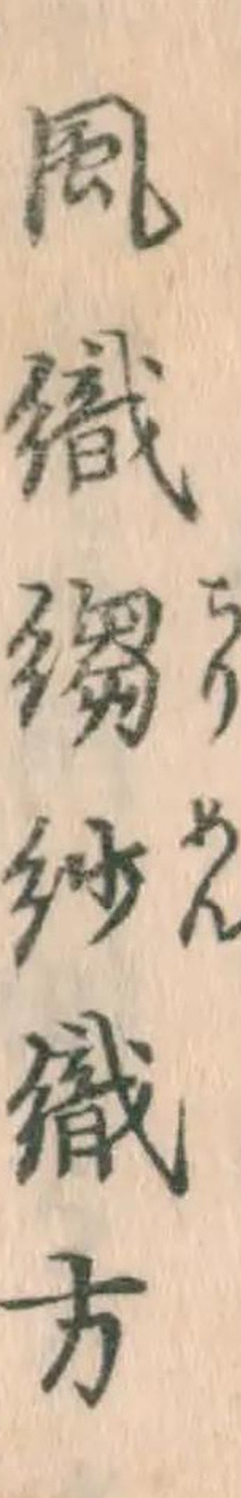風織縐紗織方
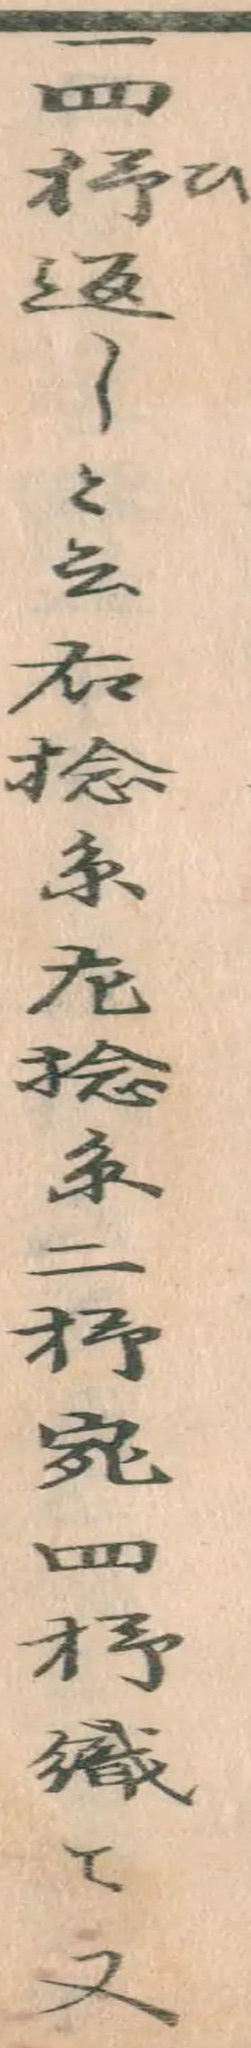一四杼返しと云右捻糸左捻糸二杼宛四杼織て又
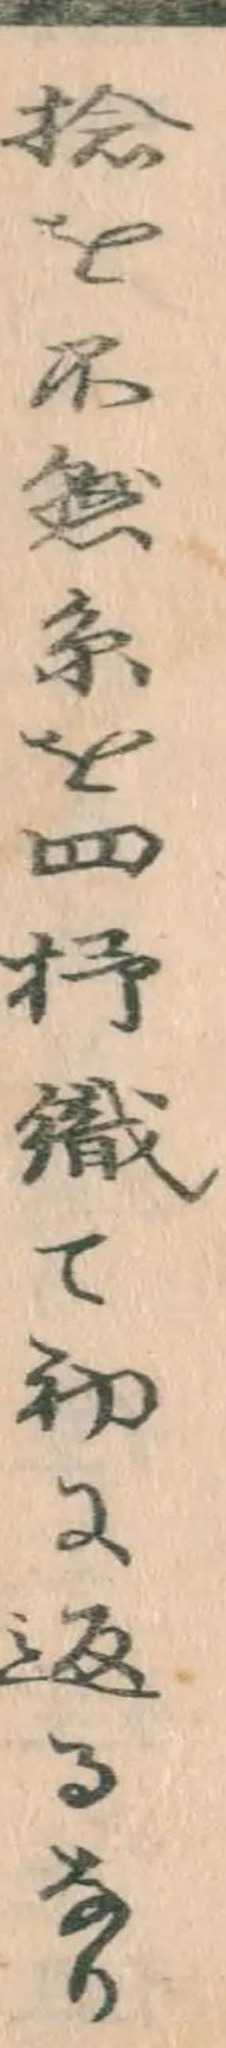捻を不懸糸を四杼織て初に返るなり

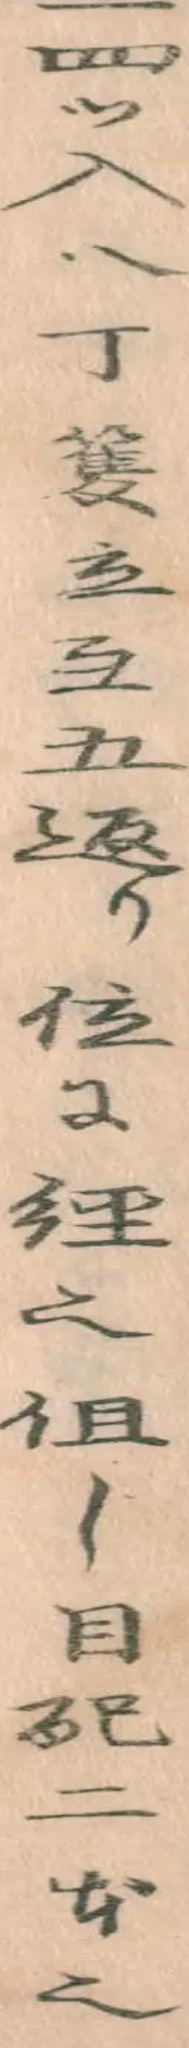一四ッ入八丁篗立互五返り位に経也但し目配二本也
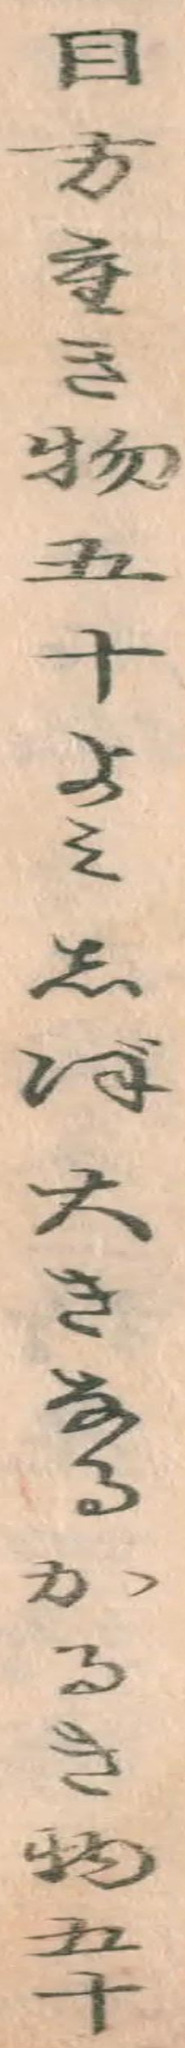目方重き物五十よみしぼ大きなるかるき物五十
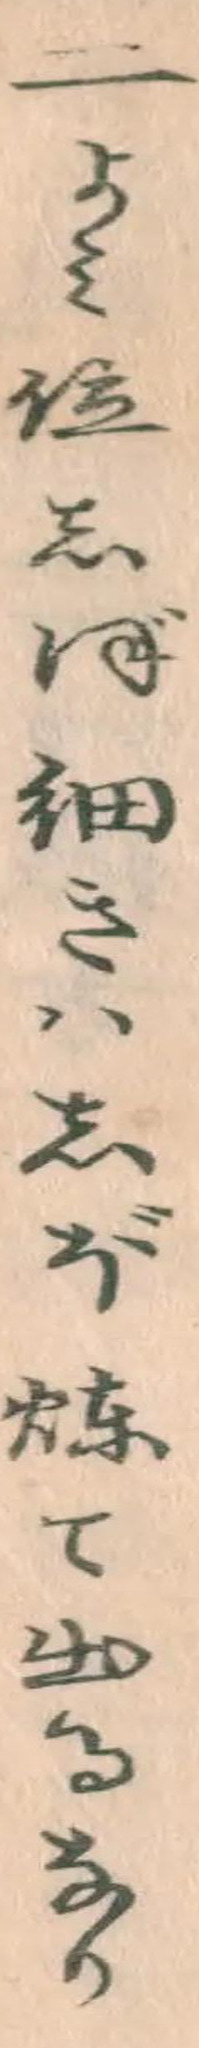一よみ位しぼ細きはしぼ煉て出るなり
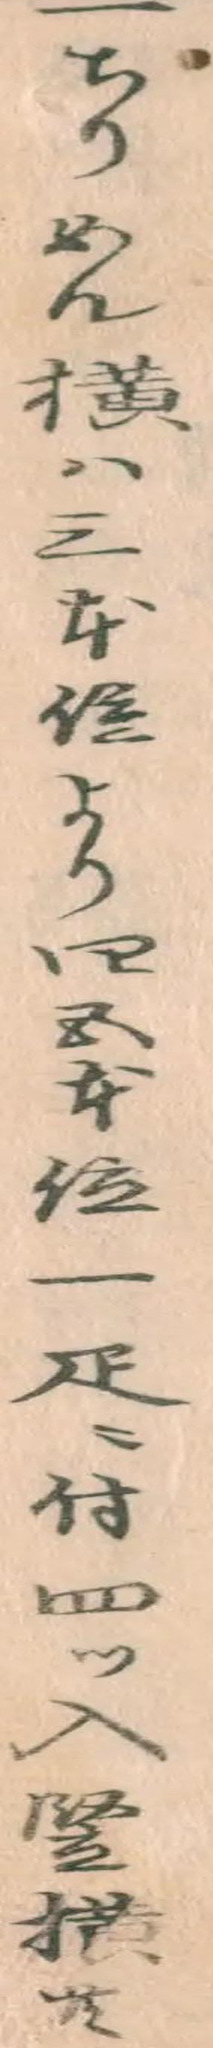一ちりめん横は三本位より四五本位一疋に付四ッ入竪横共
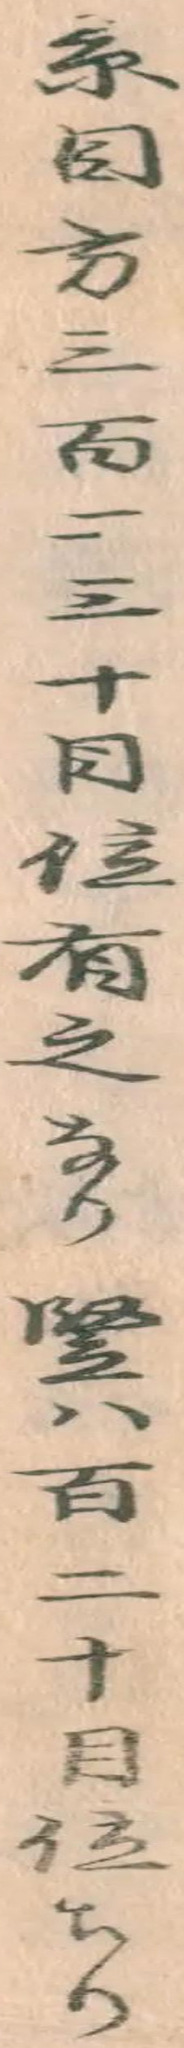糸目方三百二三十目位有之なり竪は百二十目位ちり
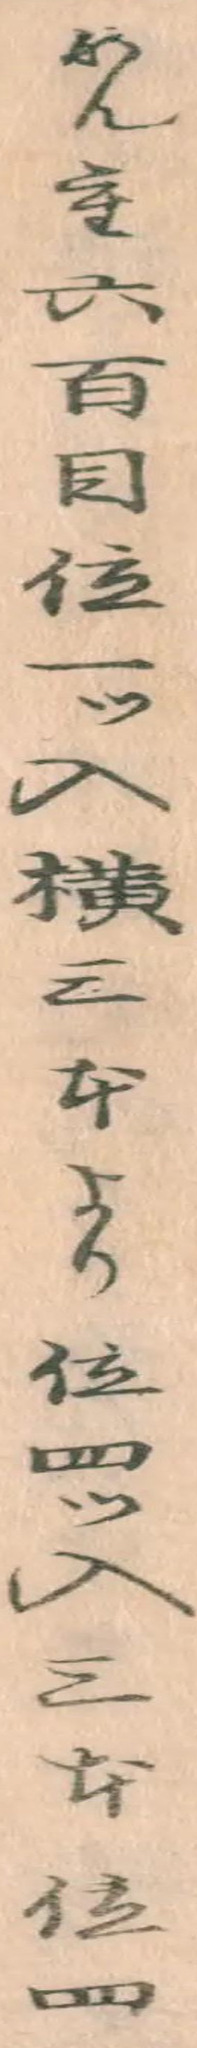めん重六百目位一ッ入横三本より位四ッ入三本位四
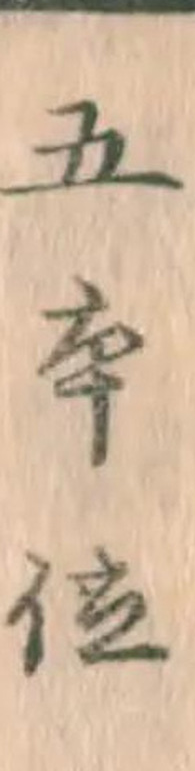五本位
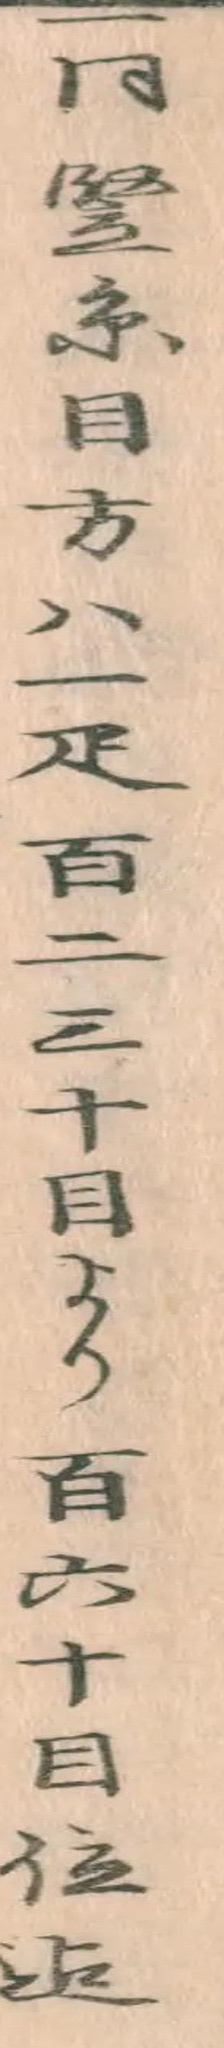一同竪糸目方は一疋百二三十目より百六十目位迄
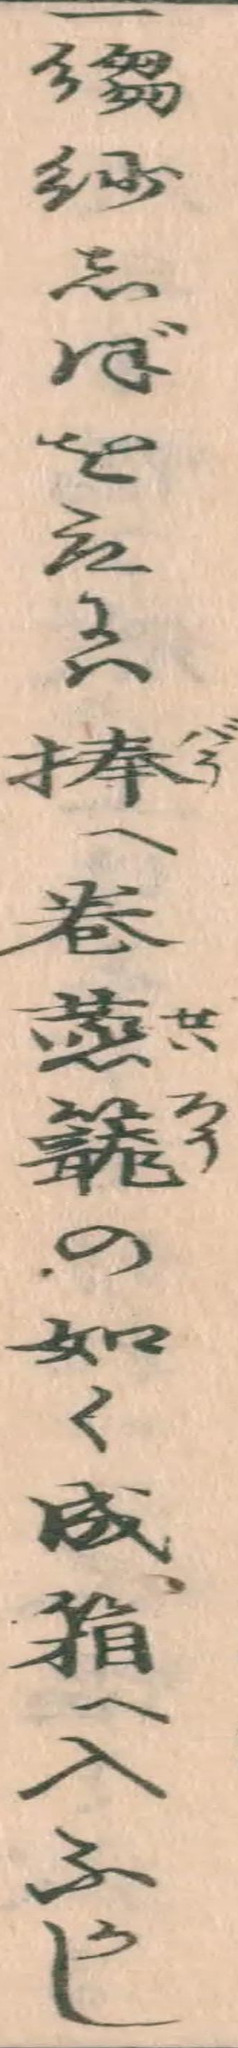一縐紗しぼを取には棒へ巻蒸籠の如く成箱へ入ふかし
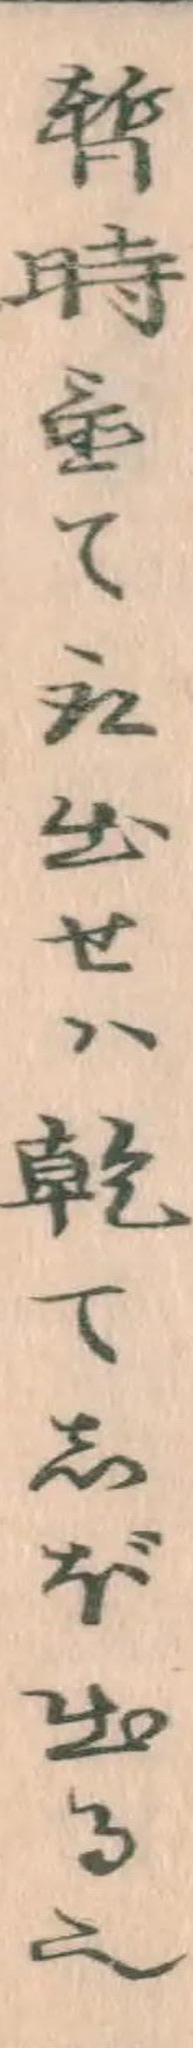暫時置て取出せは乾てしぼ出る也
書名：機織彙編 5巻. [2]
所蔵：国立国会図書館 National Diet Library, JAPAN
